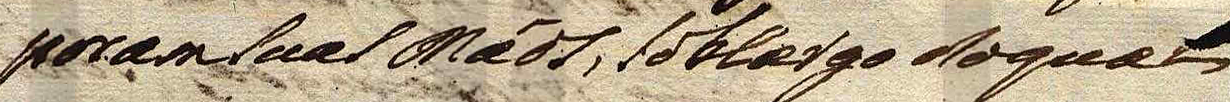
poram suas mãos, sobcargo do qua_
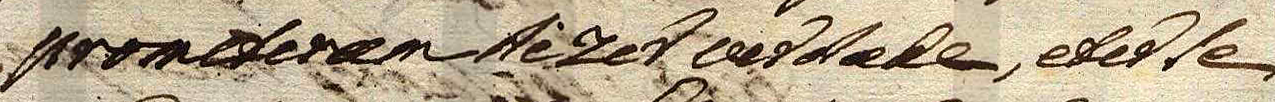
prometeram dizer verdade, e ter se
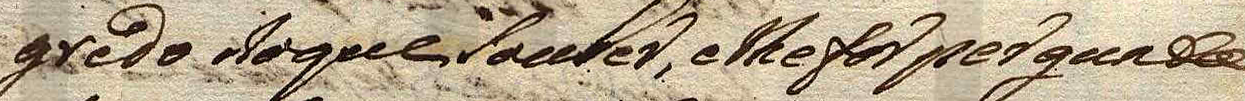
gredo do que souber, e lhe for pergunta
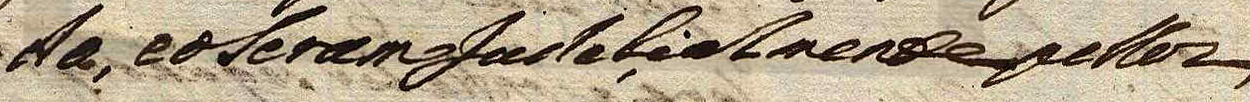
do, e o Seram JudiÇialmente pelloz
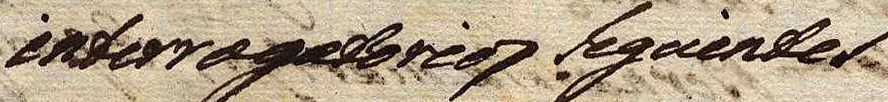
interrogatorios seguintes
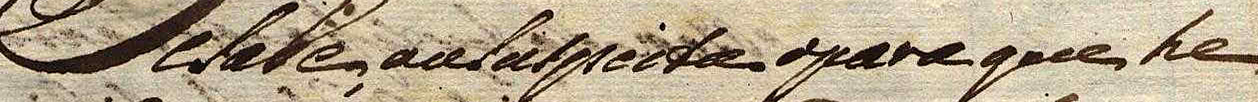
Se sabe, ou suspeita o para que he
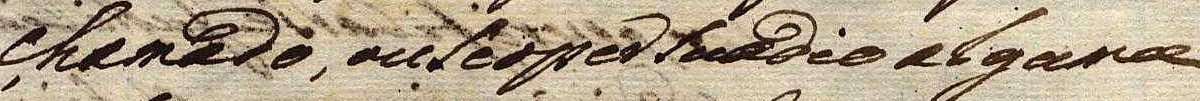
çhamado, ou se o persuadio alguma
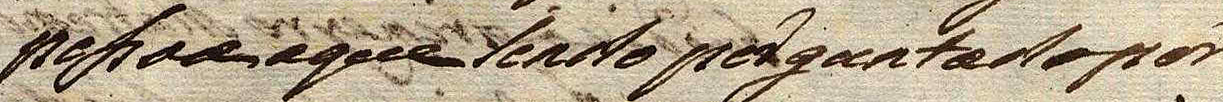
pessoa a que sendo perguntado por
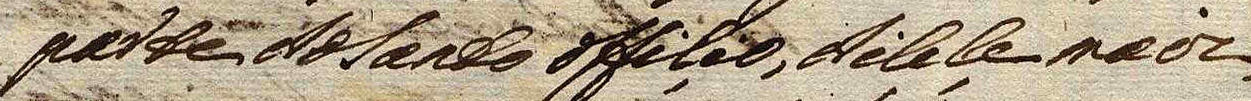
parte do Santo offiÇio diÇeÇe maiz
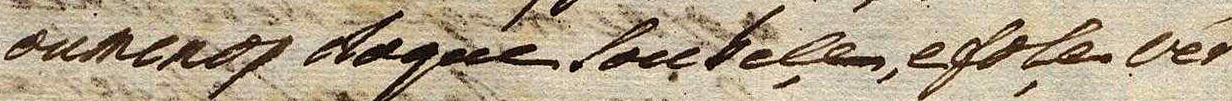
ou menos do que soubeçe, e foÇe ver
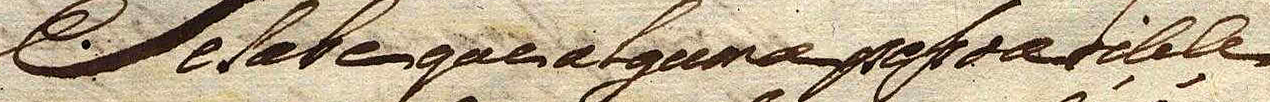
Se sabe que alguma pesoa diÇeÇe
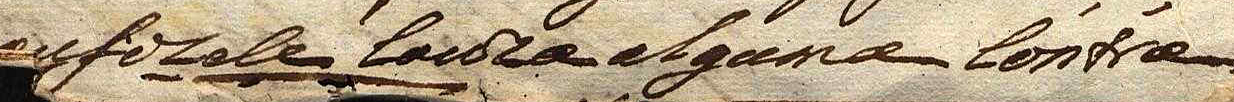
ou fizece Couza alguma Contra
